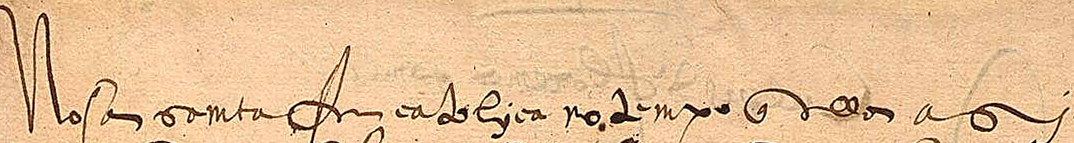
Nosa samta fee catolyca no tempo q̄ ella asy
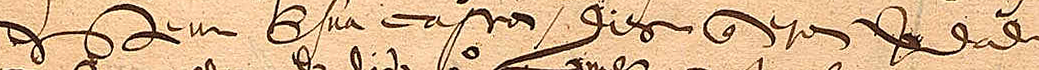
esteue ē sua casa / dise q̄ era ꝟdade
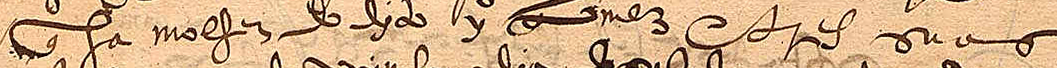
q̄ ha molher do dyto yo gomez e tres suas
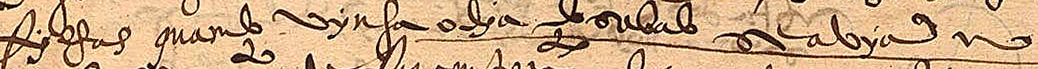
fylhas quando vynha o dya do sabado se avyā no
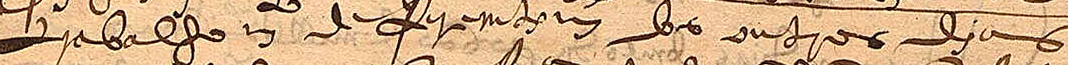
trabalho mto deferemtemte dos outros dyas
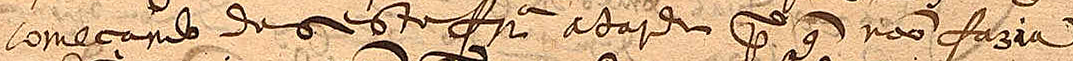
começando de sesta fra a tarde p̄oq̄ não faziā
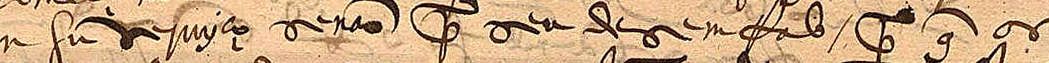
nhū seruyço senão p̄o seu desemfado / p̄oq̄ os
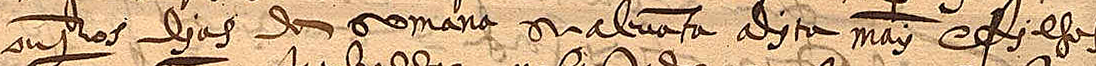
outros dyas da somana se aleūanta a dyta mãy e fylhas
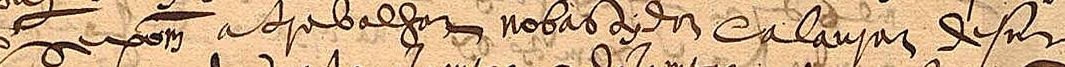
e se pom a trabalhar no bastydor e a laurar desne
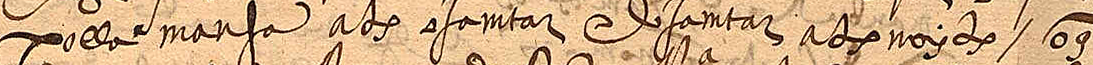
polla manhā ate o Jamtar e do Jamtar ate noyte / o q̄
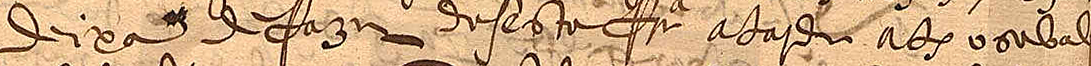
deixā de fazer de sesta fra a tarde ate o sabad
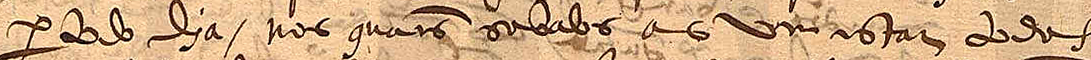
ꝑ todo dya / nos quaes sabados as vee estar todas
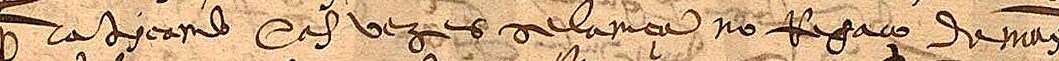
pratycando e as vezes se lamçā no Regaço da mãy
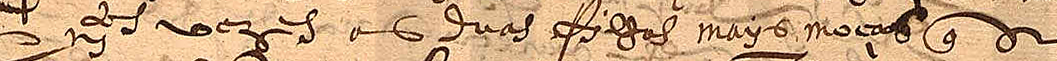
e mtas vezes as duas fylhas mays moças q̄ se
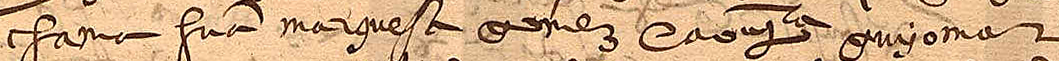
chama huā marquesa gomez e a outra guyomar
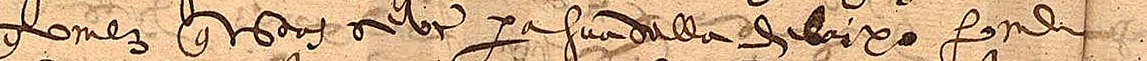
gomez q̄ estas se vē ꝑa hūa salla de baixo honde
